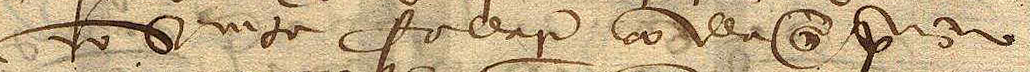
c̄osjmta fallarē cō ella sē p̄imro
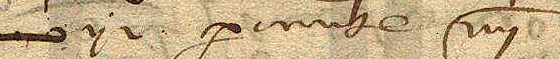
vyr ꝑamte m̄j
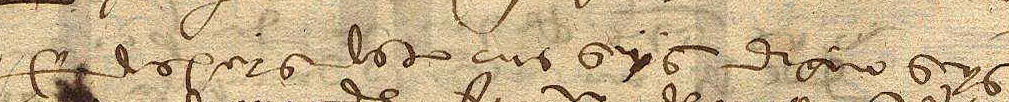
E despois desto aos seys diguo seys
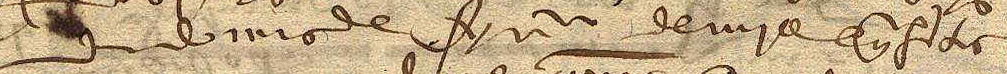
di do mes de fjuro de mjll e q̄nhsētos
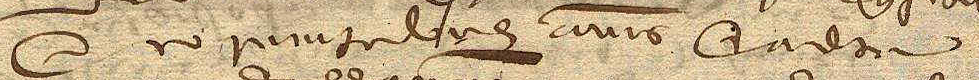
e coremta dous ānos ē a dta
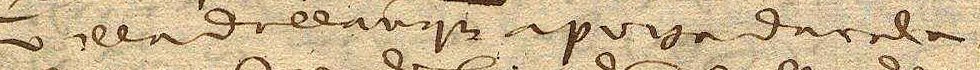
villa dallanq̄r a porta da cadea
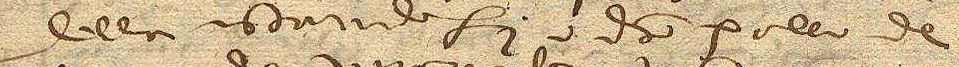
della estando hj o dt̄o pallo de
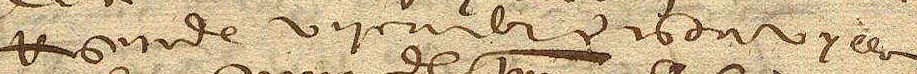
Resende vereador ē esta vylla
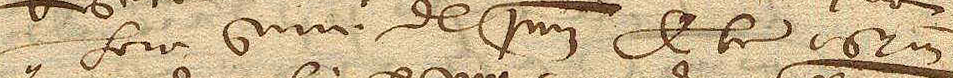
q̄ hora serue de juiz E bē asym
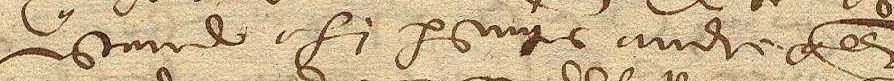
estando ahj ꝑsentes andre gl̄lz
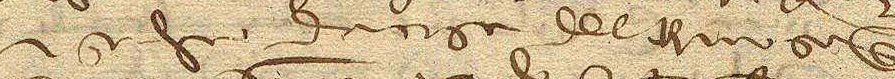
escdro da casa dell Rej noso s̄or
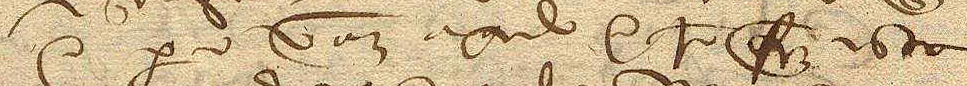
e ꝑo vāz agudo e Jō fr̄z esta
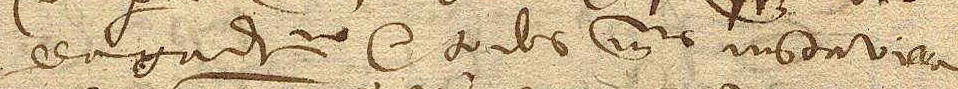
llagadrro e todos mores nesta villa
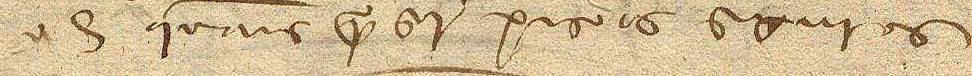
os qoaes p̄o serē pesoas seguras
